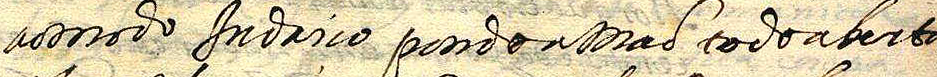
ao modo Judaico pondo a maõ todo aberta
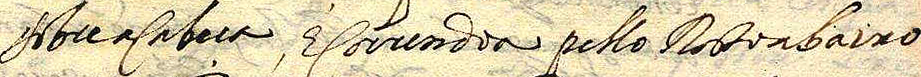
sobre a Cabeça, E Correndoa pello Rosto abaixo
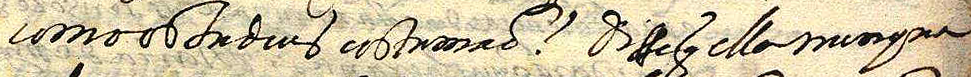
como os Iudeus costumaõ? Disse q̄ ella nunqua
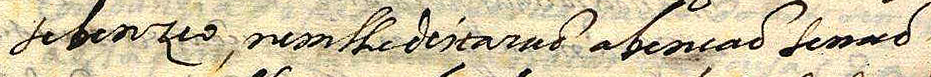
se benzeo, nem lhe deitaraõ a bençaõ senaõ
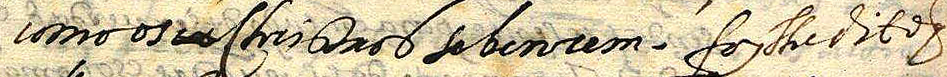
como os iu Christaos se benzem. foylhe dito q̄
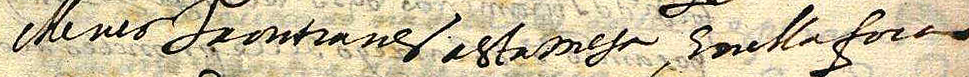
elle ueo Ja outra ues a esta mesa, E nella fora
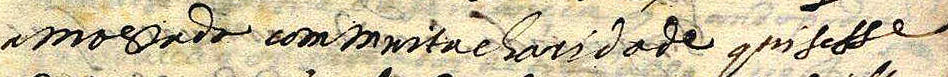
amoestada com muita charidade quisesse
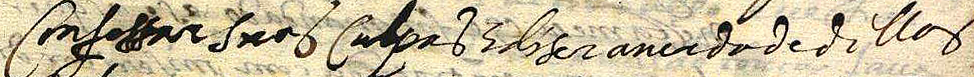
Confessar suas Culpas E diser a uerdade dellas
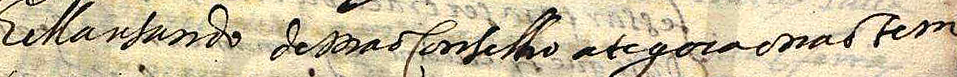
E ella usando de mao Conselho ate gora o naõ tem
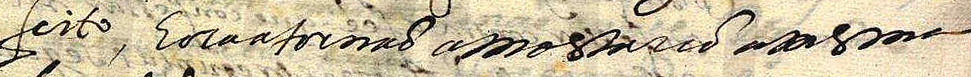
feito, E ora a tornaõ amoestar cō a mesma
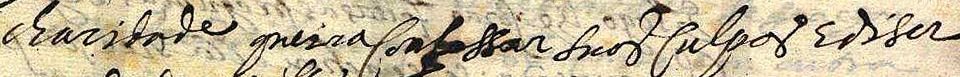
charidade queira Confessar suas Culpas E diser
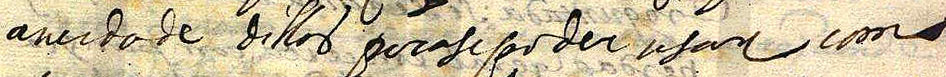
a uerdade dellas pera se poder usar com
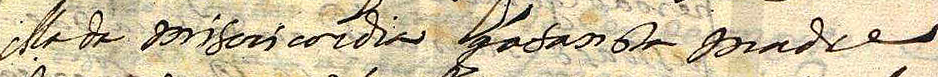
ella da misericordia q̄ a santa madre
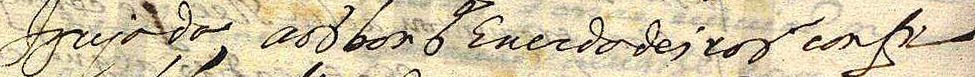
Jgreja da aos bons E uerdadeiros confi
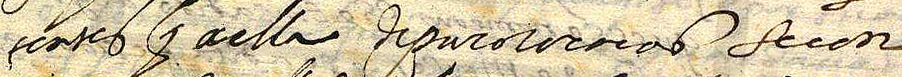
tentes q̄ a ella de puro coracaõ se con
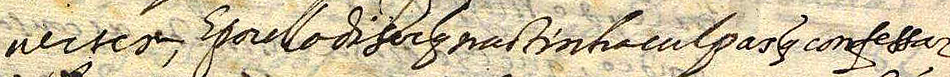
uertem, E por ella diser q̄ naõ tinha culpas q̄ confessar
